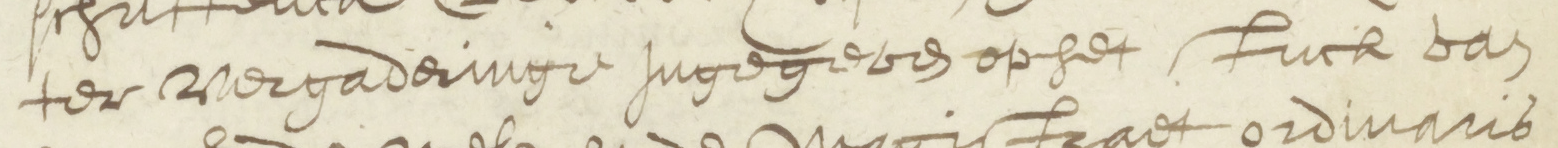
ter vergaderinge Ingegeven op het stuck van
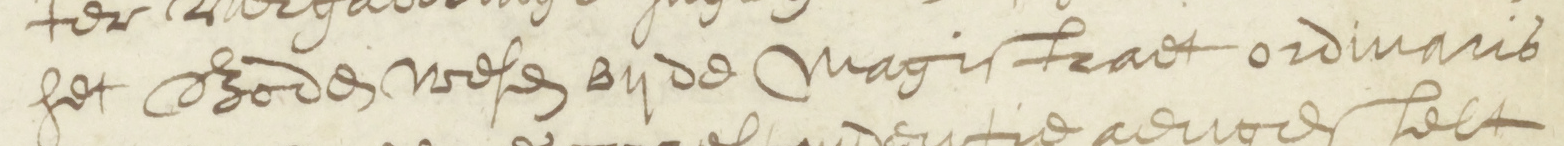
het Bodenwesen bij de magistraet ordinaris
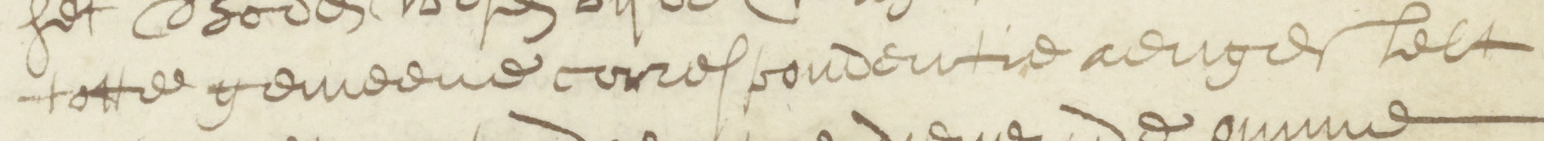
totte gemeene correspondentie aengestelt
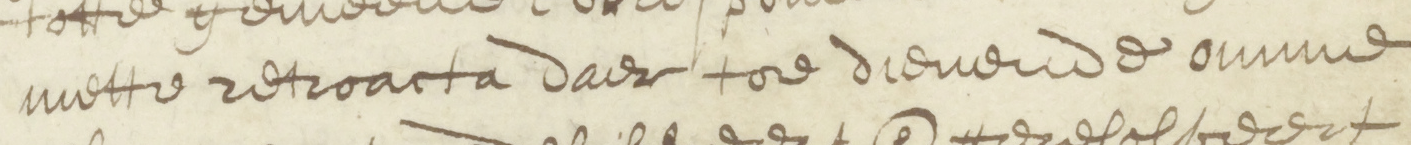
mette retroacta daer toe dienende omme
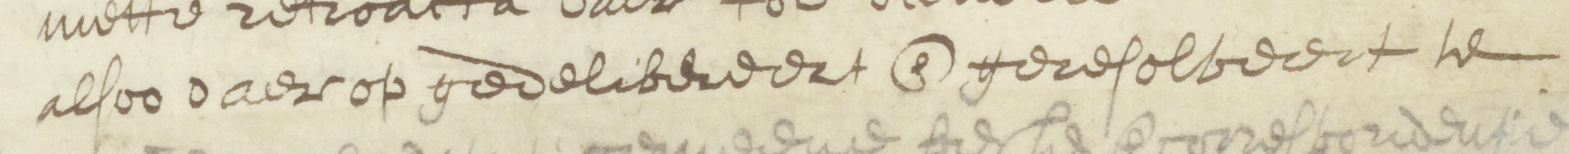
alsoo daer op gedelibereert & geresolveert te
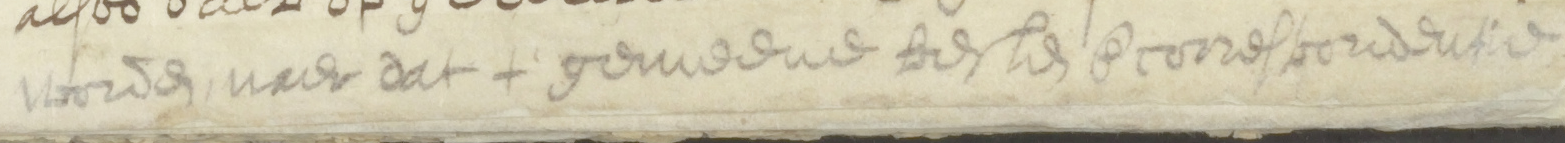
worden, naer dat t'gemeene besten & correspondentie
